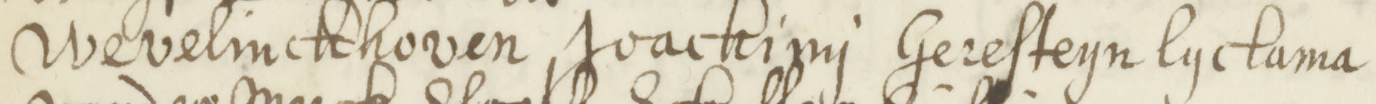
Wevelinckhoven, Joachimi Geresteyn lyclama
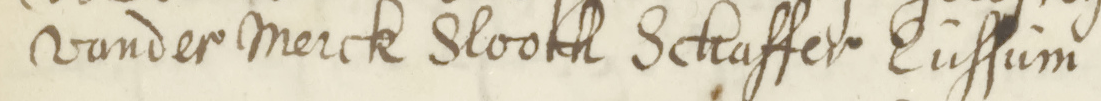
vander Merck Slooth Schaffer Eussum
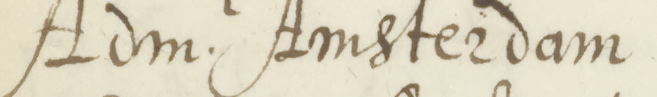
Admt. Amsterdam
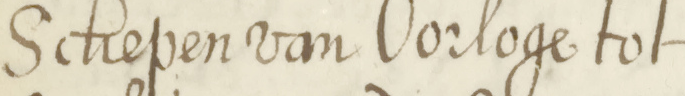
Schepen van Oorloge tot
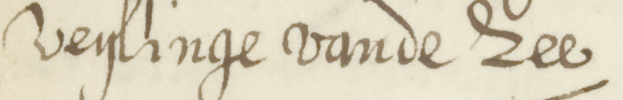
Veylinge vande Zee
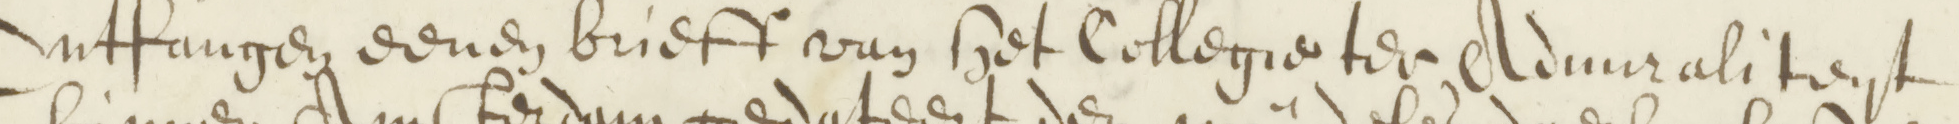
Ontfangen eenen brieff van het Collegie ter Admiraliteyt
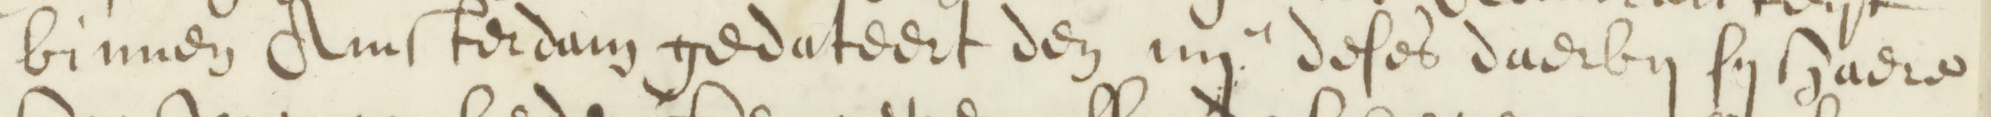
binnen Amsterdam gedateert den iiijen deses daerby sy haere
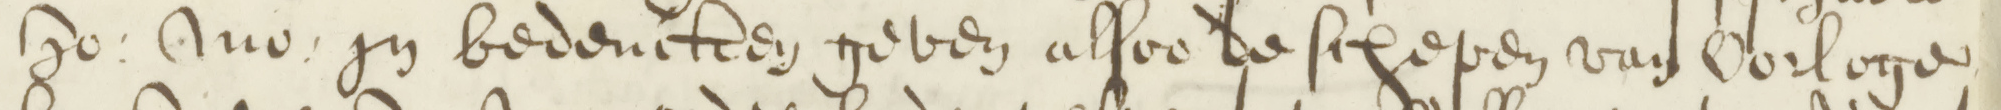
Ho:Mo: in bedencken geven alsoo de schepen van Oorloge
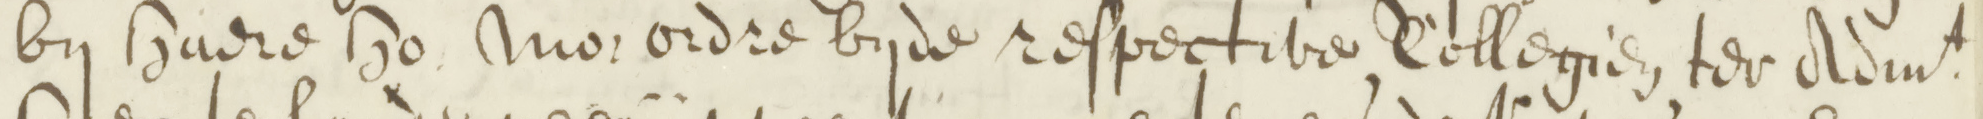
by Haere Ho:Mo: ordre byde respective Collegien ter Admt.
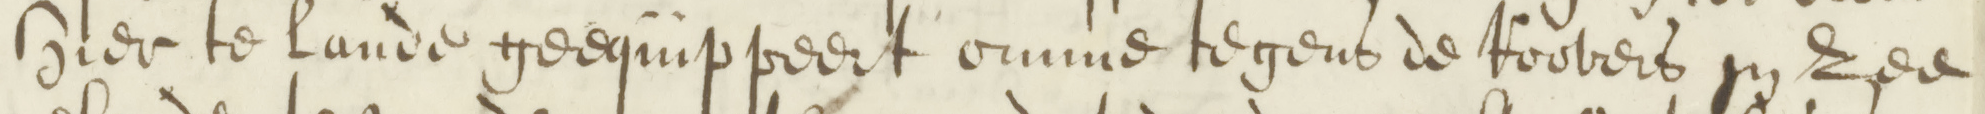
Hier te lande geequippeert omme tegens de Roovers in Zee
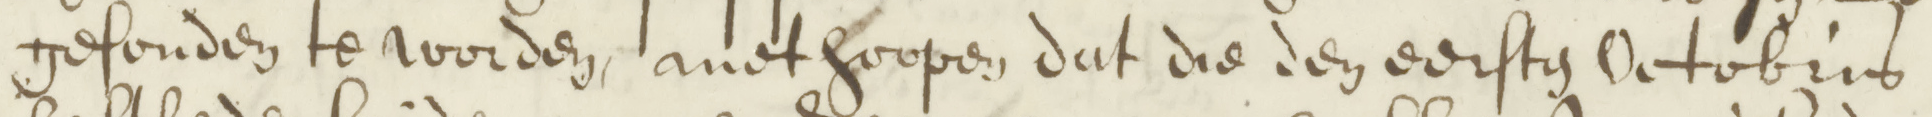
gesonden te worden, met hoopen dat die den eersten Octobris
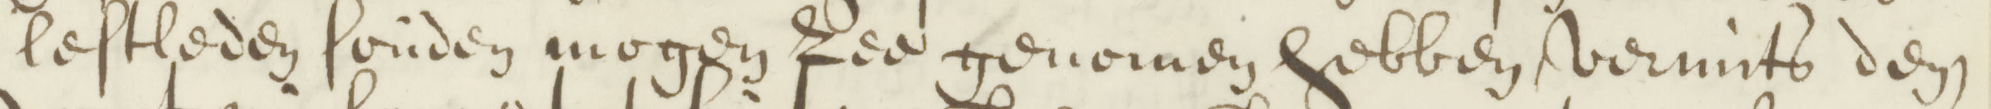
lestleden souden mogen Zee genomen hebben, vermits den
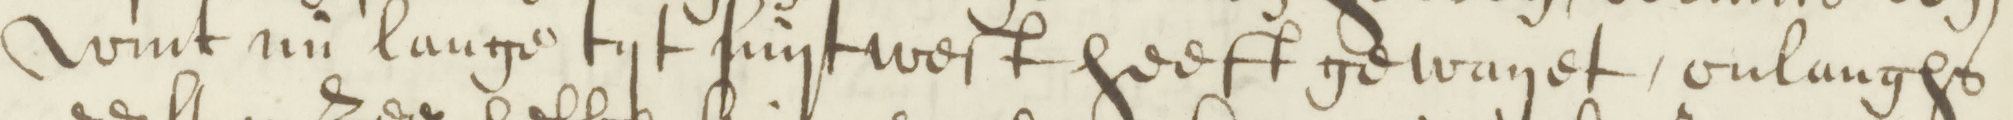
wint nu lange tyt suytwest heeft gewayet, onlanghs
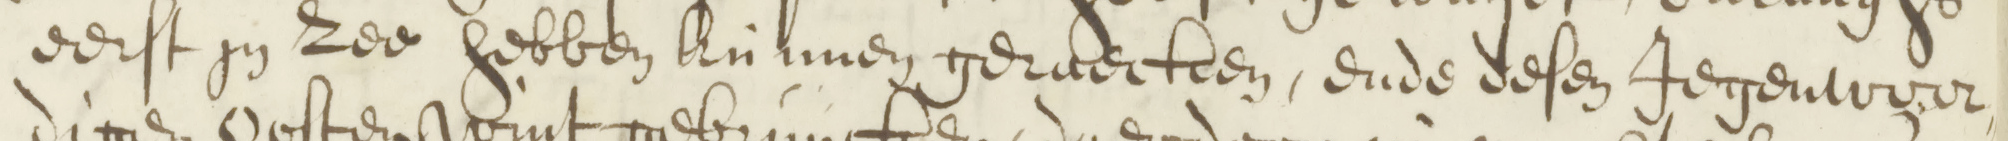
eerst in Zee hebben kunnen geraecken, ende desen Jegewoor,,
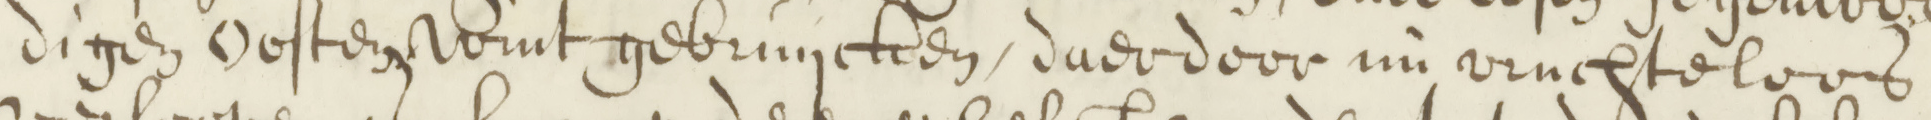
digen Oosten wint gebruycken, daerdoor nu vruchteloos
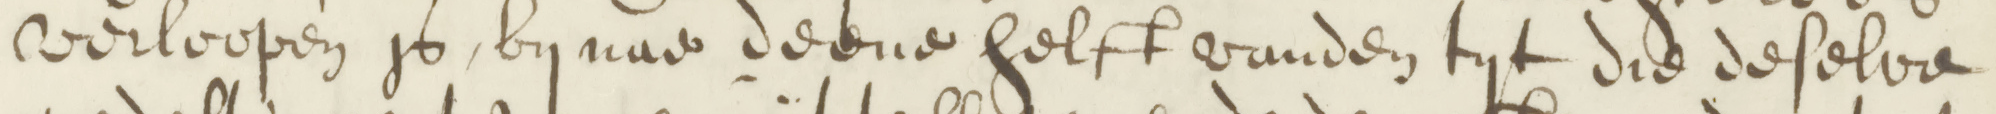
verloopen is, by nae deene helft vanden tyt die deselve
